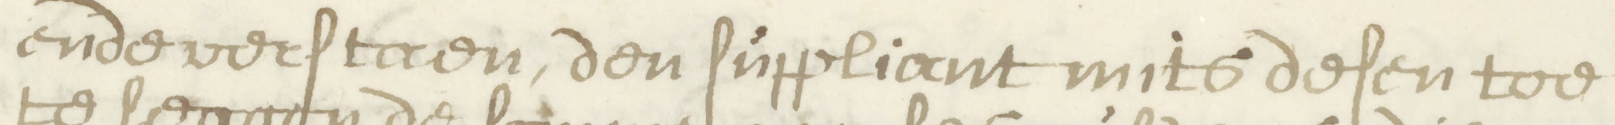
ende verstaen, den suppliant mits desen toe
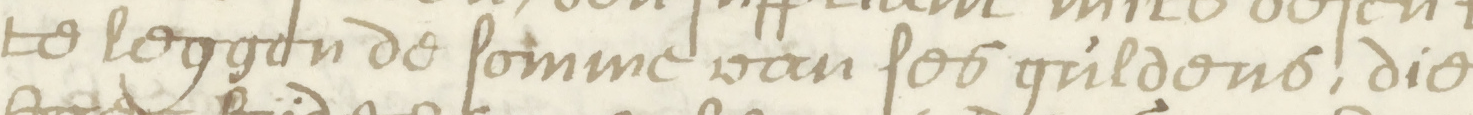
te leggen de somme van ses guldens, die
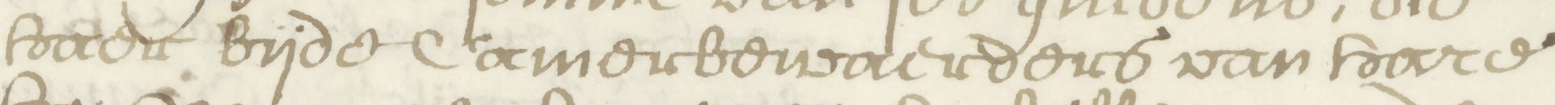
haer bijde Camerbewaerders van hare
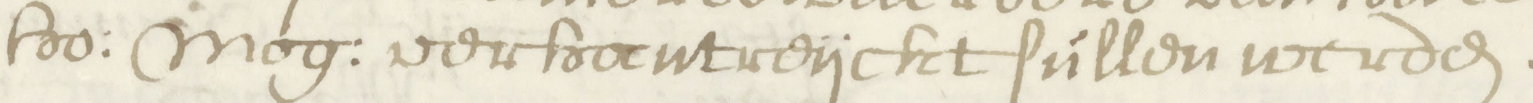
Ho:Mog: verhantreijckt sullen werden.
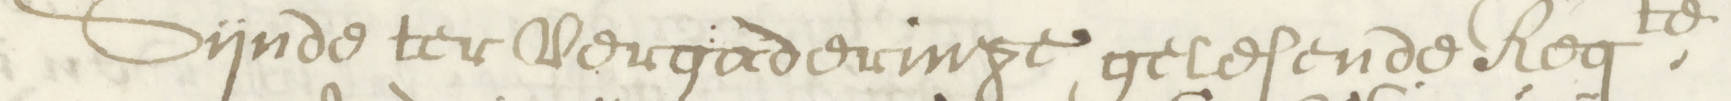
Sijnde ter Vergaderinge gelesen de Reqte.
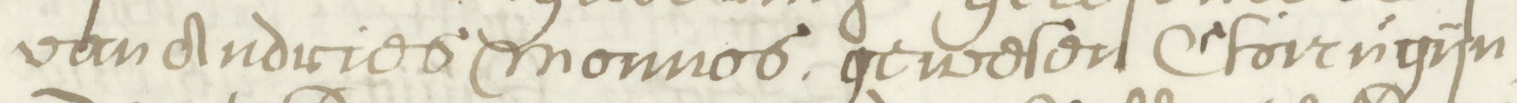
van Andries Monnos, gewesen Chirugijn
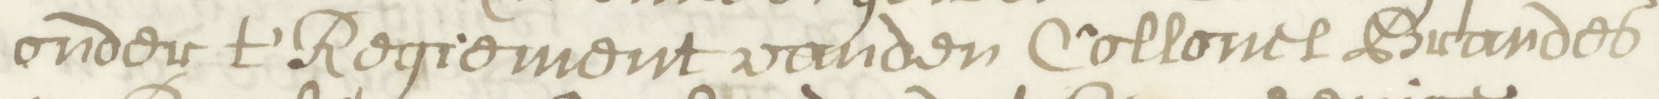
onder t' Regiement vanden Collonel Brandes
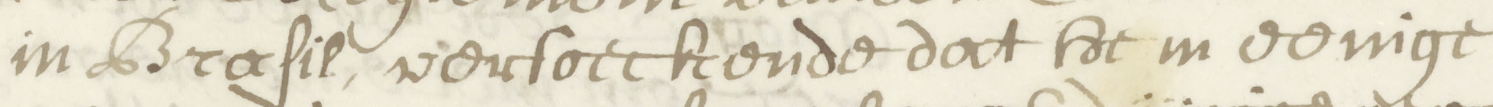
in Brasil, versoeckende dat hem eenige
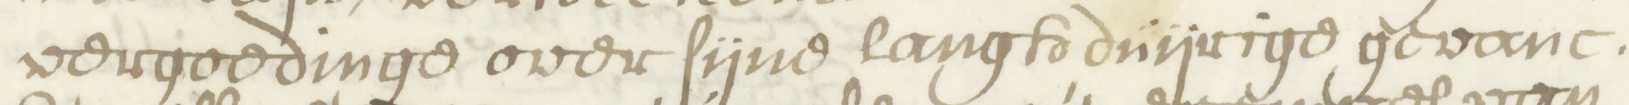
vergoedinge over sijne langh duijrige gevanc„
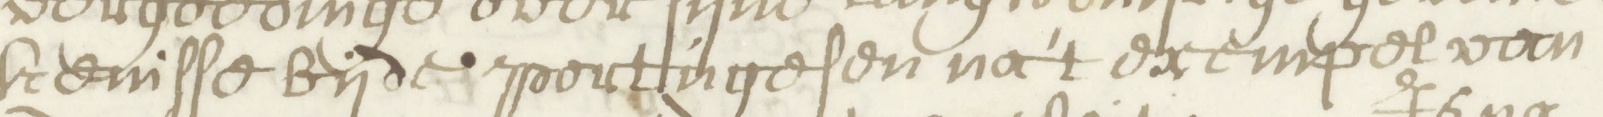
kenisse bijde portugesen na't exempel van
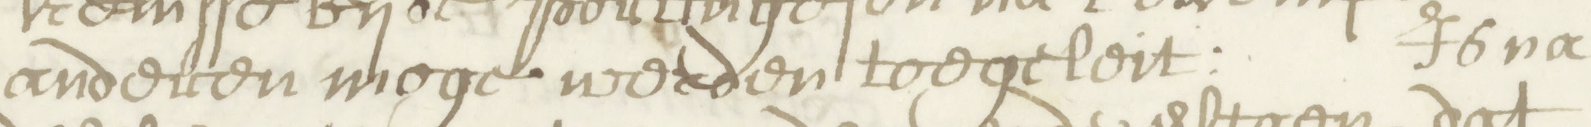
anderen moge werden toegeleit: Is na
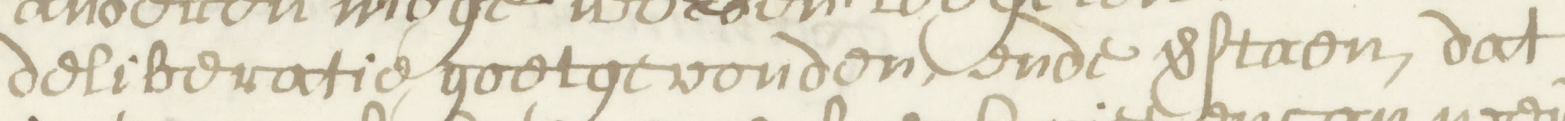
deliberatie goetgevonden, ende vstaen, dat
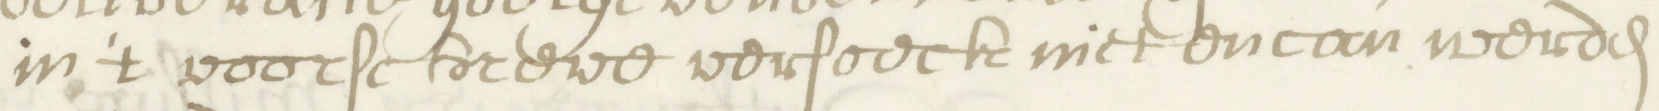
in't voorschreve versoeck niet en can werden
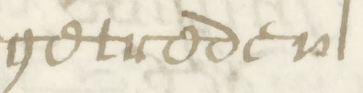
getreden.
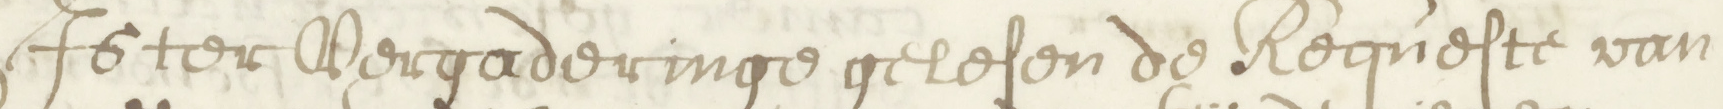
Is ter Vergaderinge gelesen de Requeste van
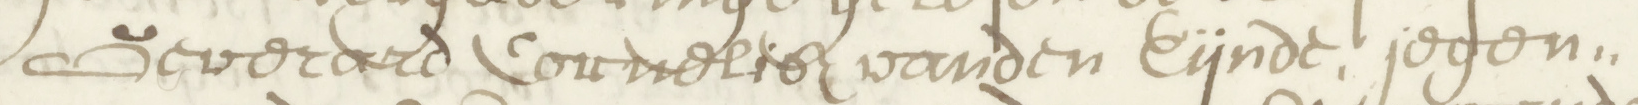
Geverard Cornelisz vanden Eijnde, jegen,,
